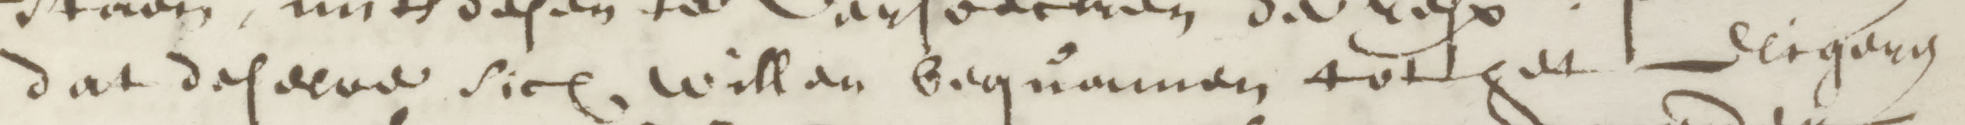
dat deselve sich willen bequamen tot het eligeren
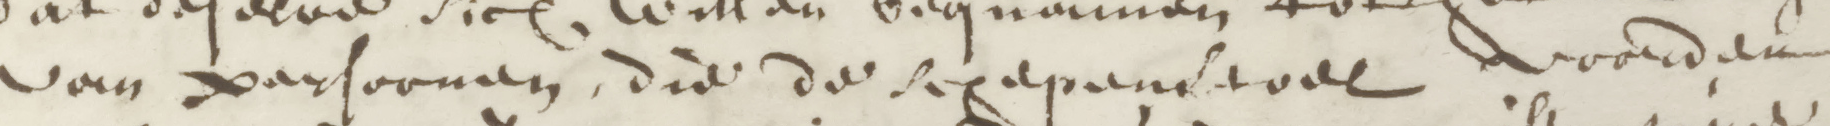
van persoonen, die de schepenstoel voorden
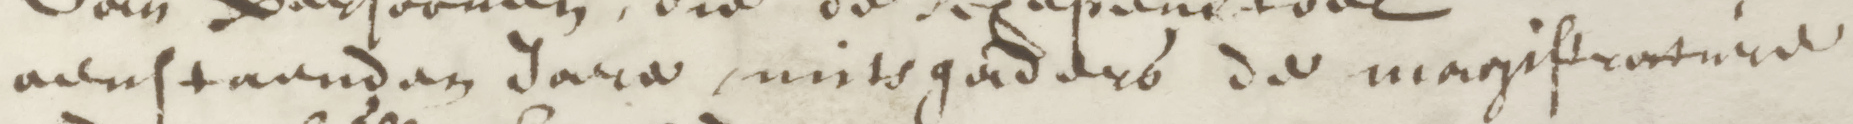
aenstaenden jare, mitsgaders de magistrature
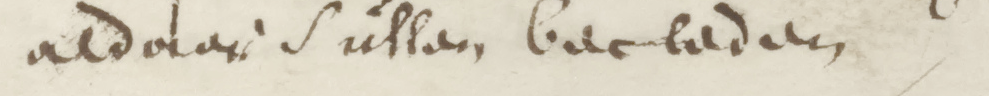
aldaer sullen becleden.
